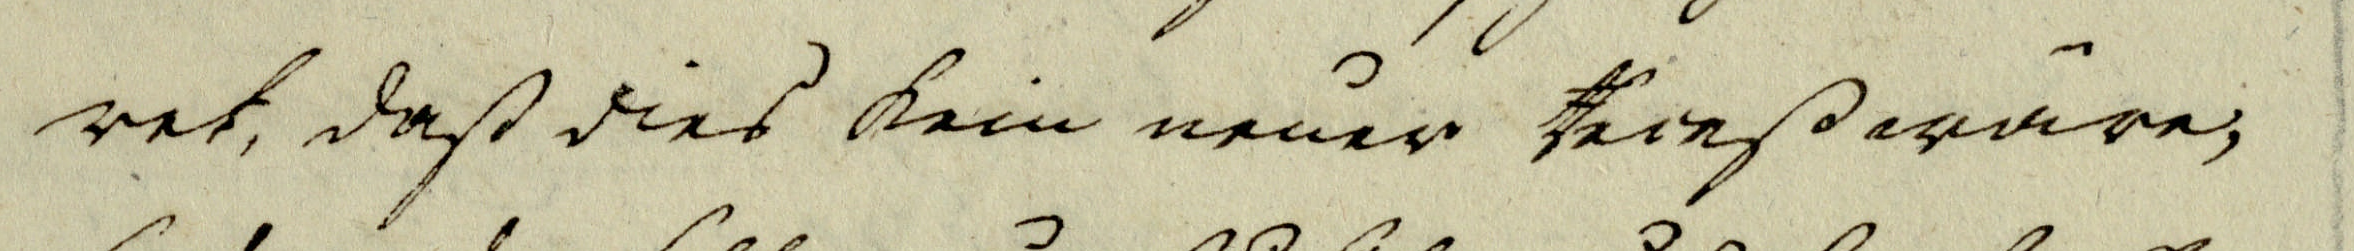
ret, daß dies kein neuer Receß wäre,
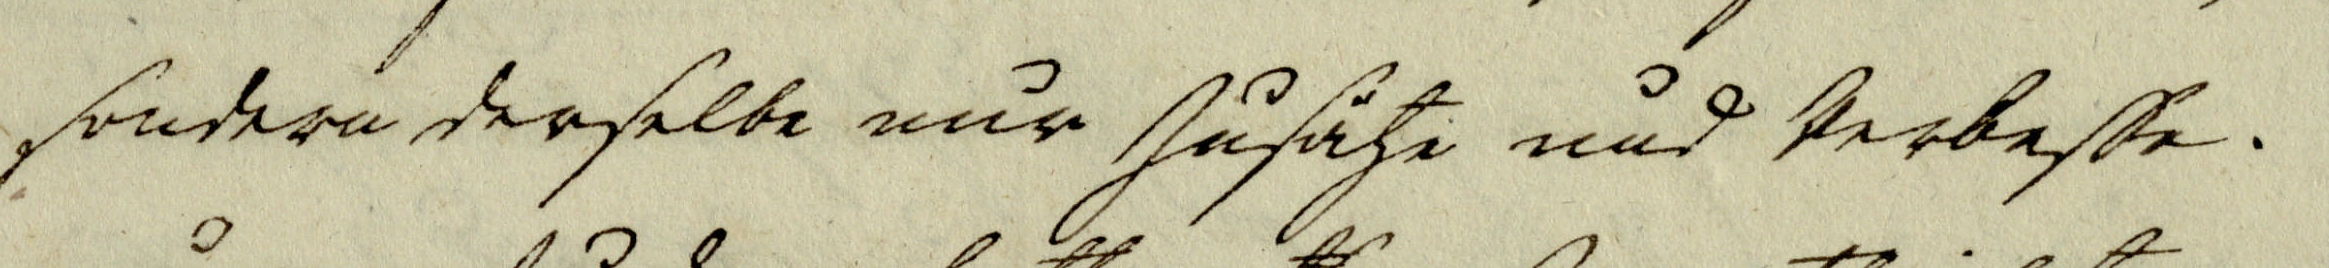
sondern derselbe nur Zusätze und Verbesse¬
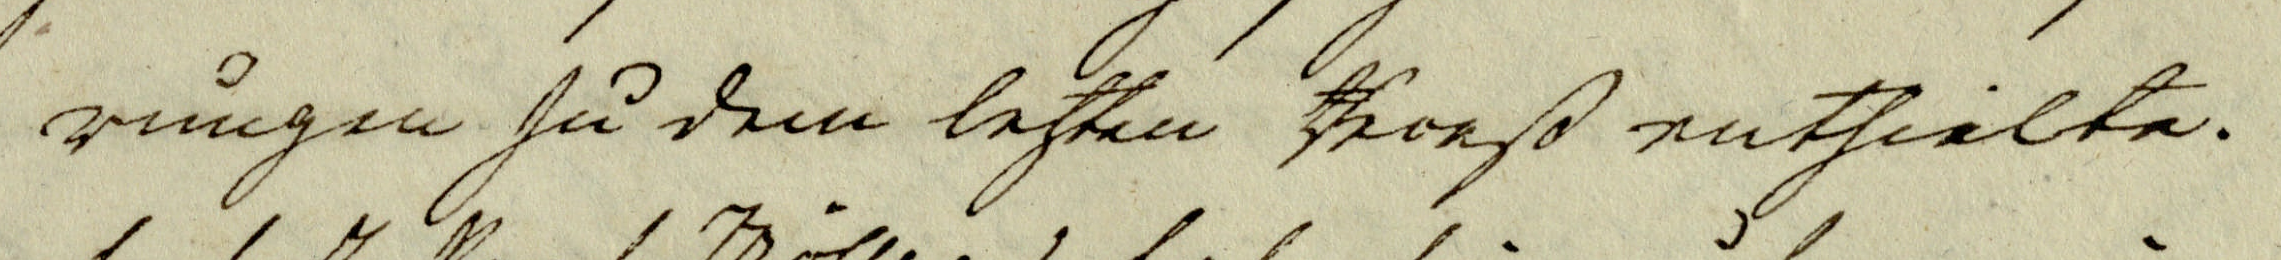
rungen zu dem letzten Receß enthielte.
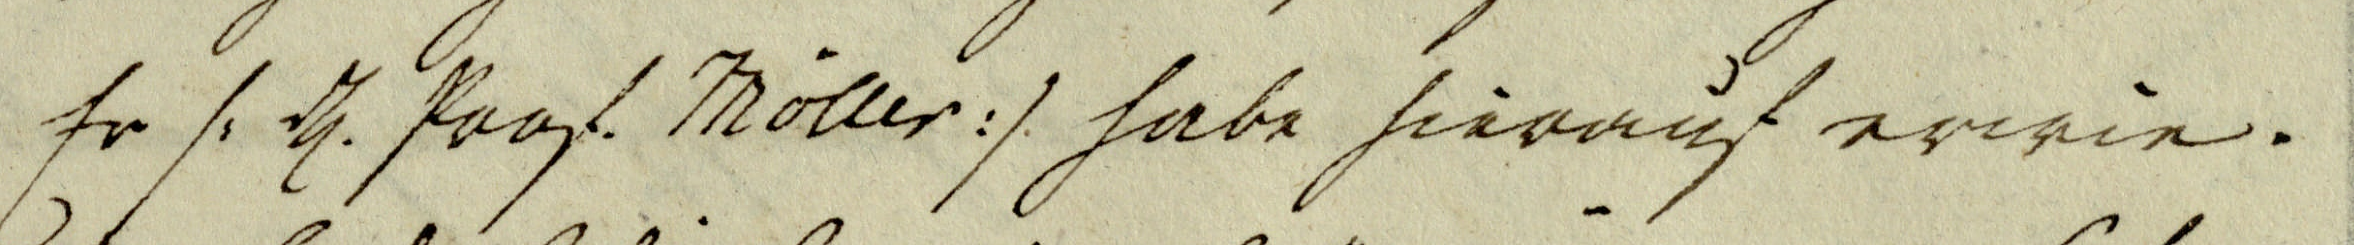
Er /. dh. Prof. Möller :/ habe hierauf erwie¬
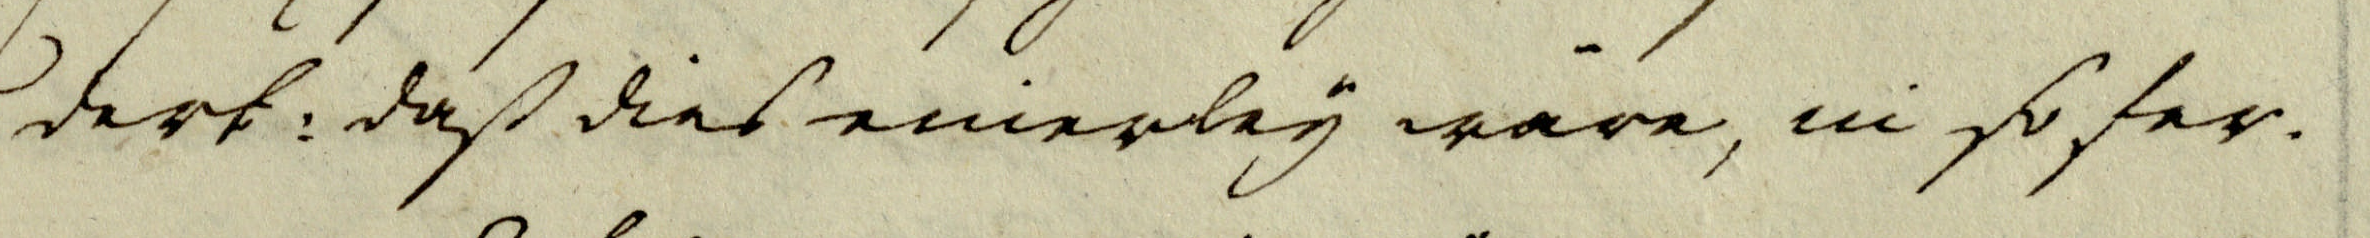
dert: daß dies einerleÿ wäre, in so fer¬
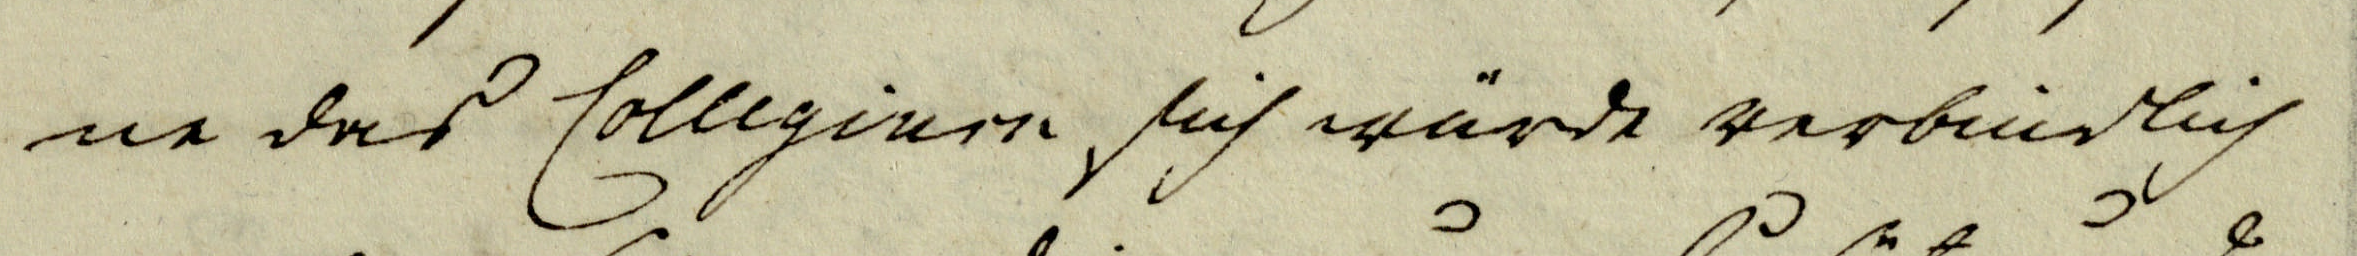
ne das Collegium sich würde verbindlich
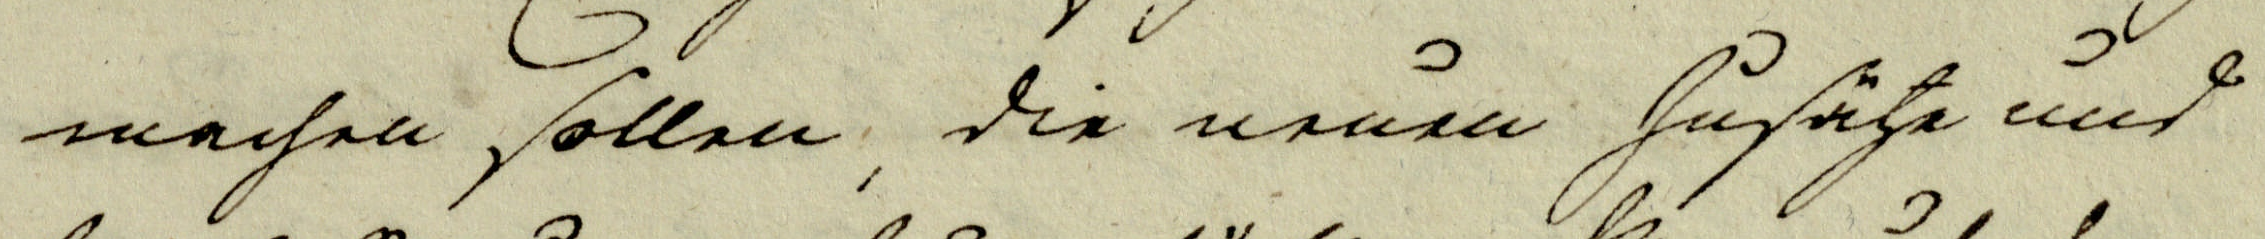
machen sollen, die neuen Zusätze und
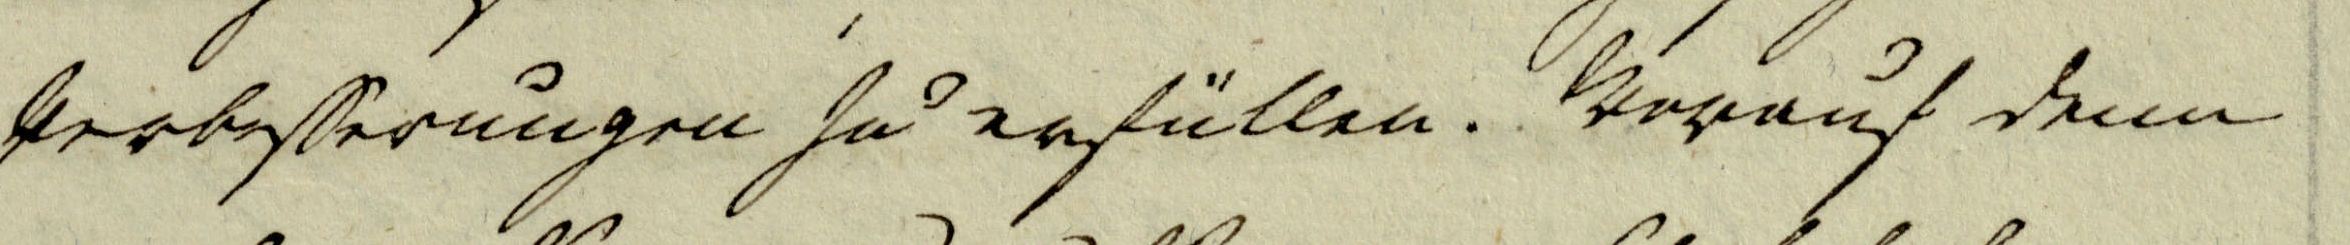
Verbesserungen zu erfüllen. Worauf denn
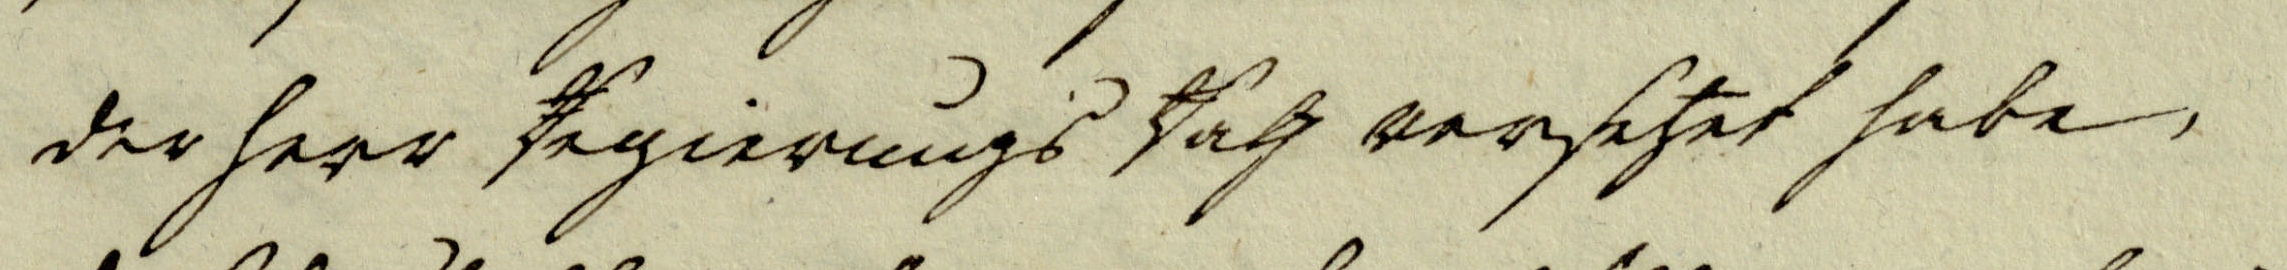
der Herr Regierungs Rath versetzet habe,
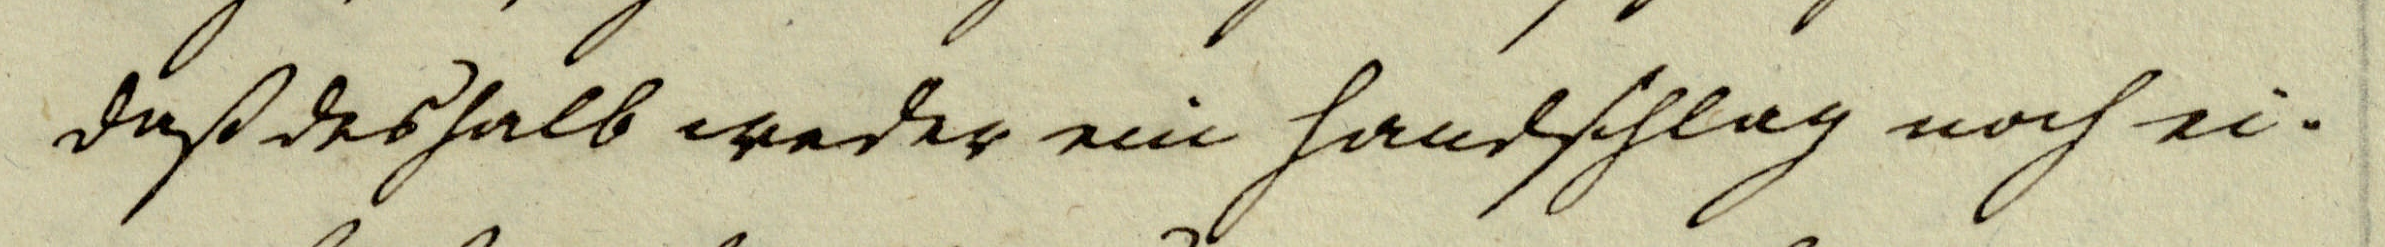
daß deshalb weder ein Handschlag noch ei¬
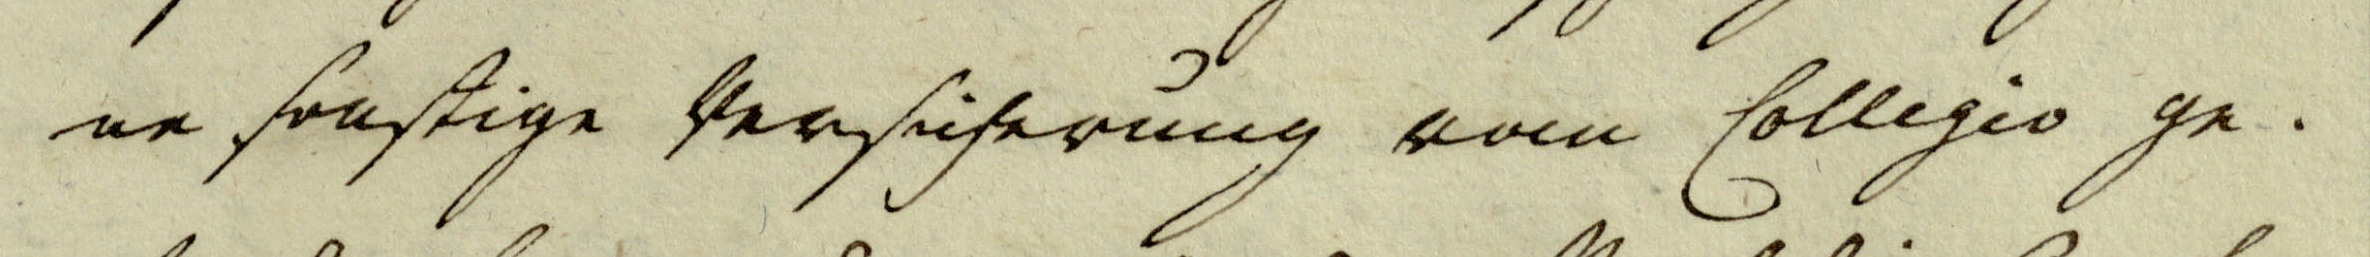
ne sonstige Versicherung vom Collegio ge¬
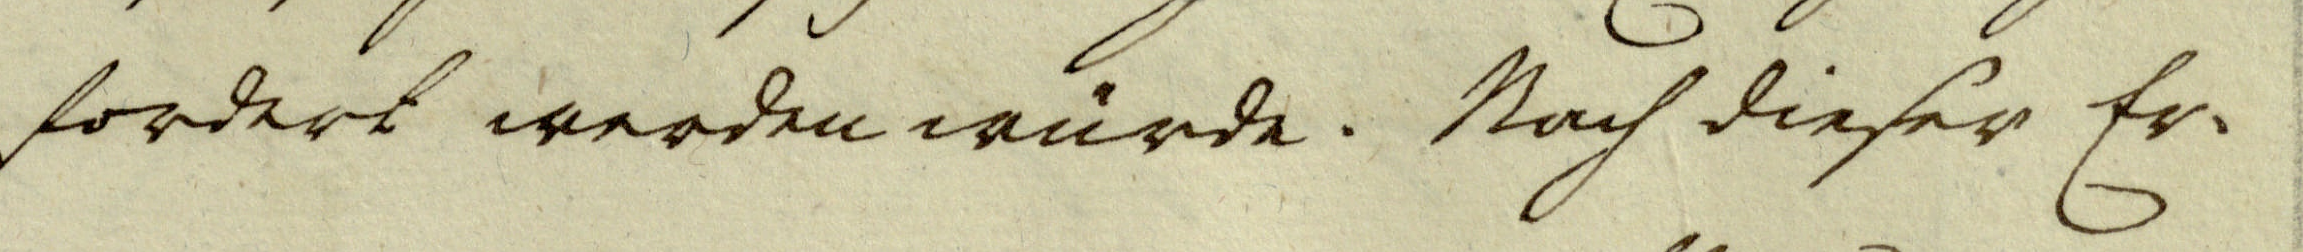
fordert werden würde. Nach dieser Er¬
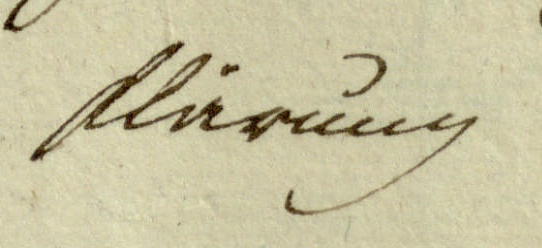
klärung
